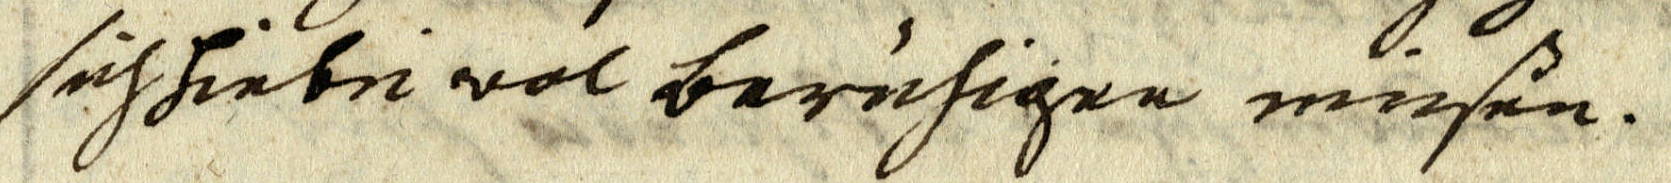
sich hiebei wol beruhigen müßen.
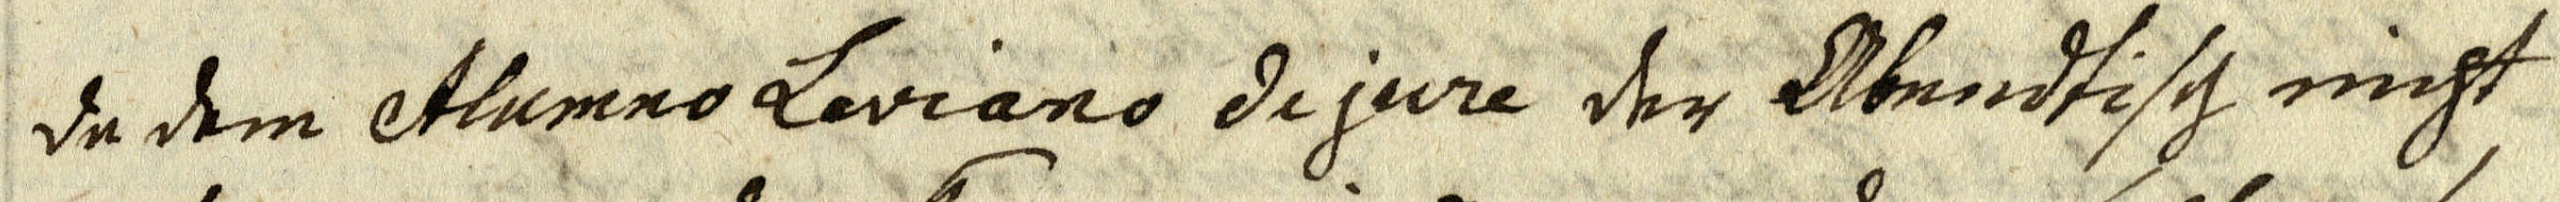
Da dem Alumno Leviano de jure der Abendtisch nicht
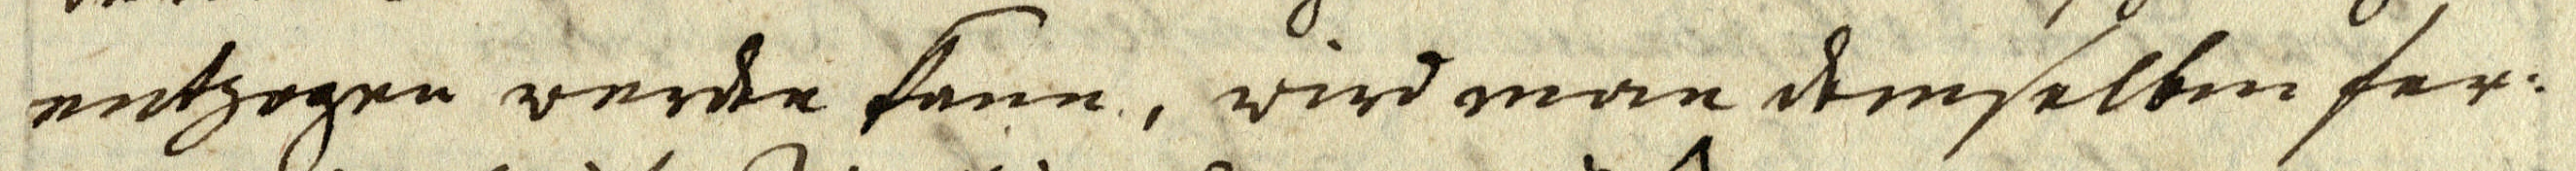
entzogen werden kann, wird man demselben fer¬
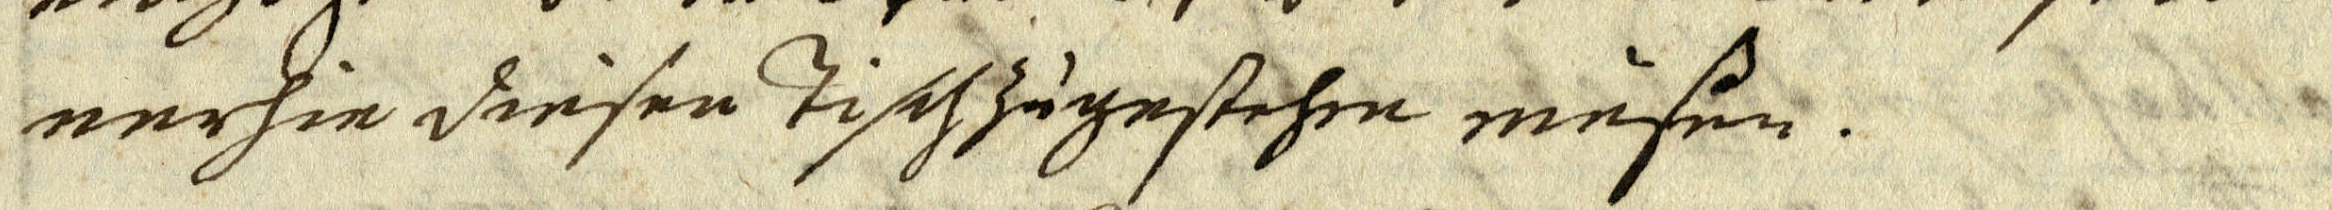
nerhin diesen Tisch zugestehen müßen.
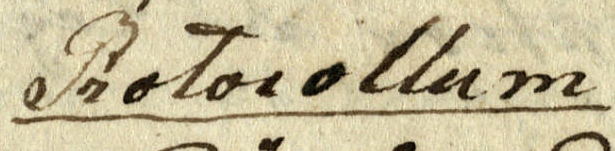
Protocollum
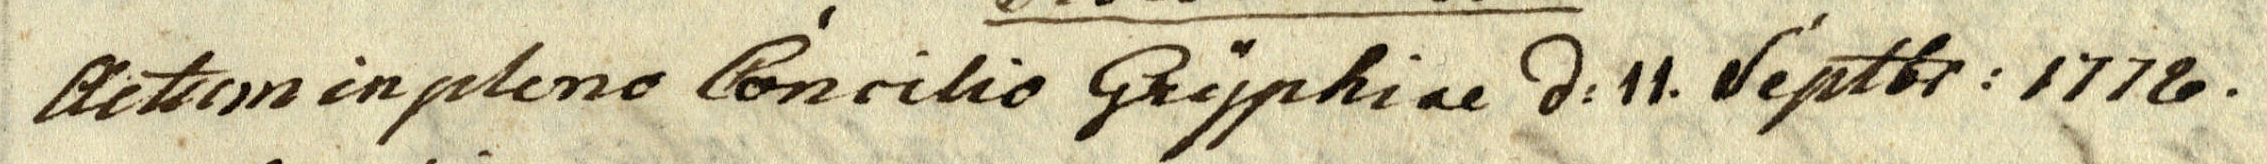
Actum in pleno Concilio Grÿphiae d. 11. Septbr. 1778.
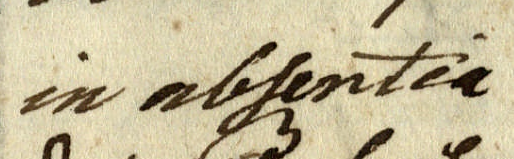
in absentia
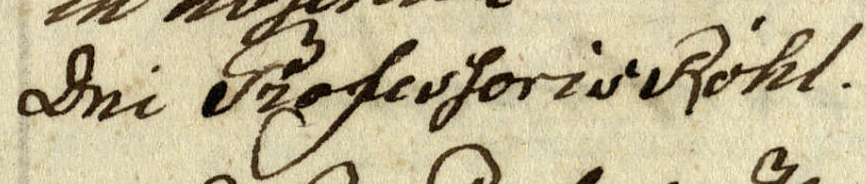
Dei Professoris Röhl.
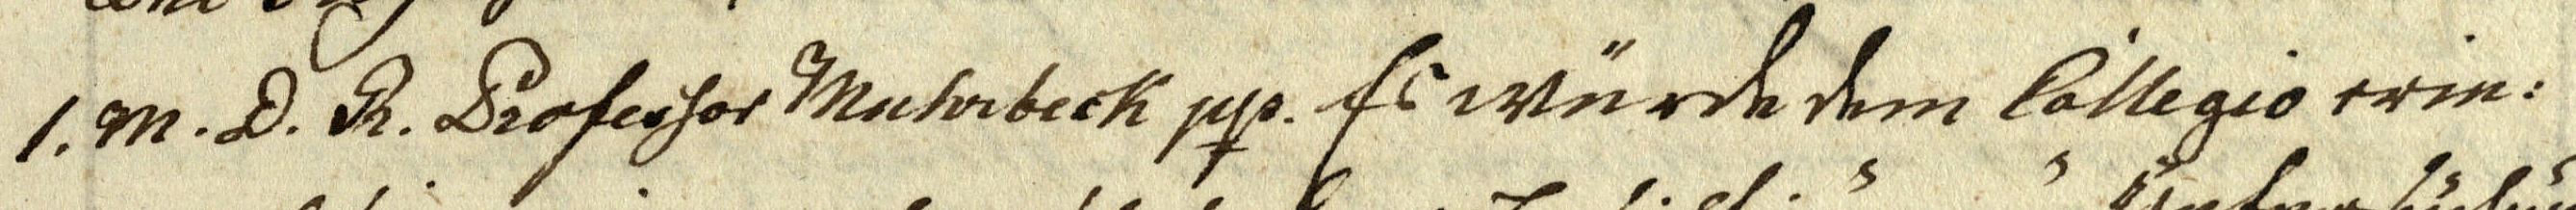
1. M. D. R. Professor Muhrbeck pp. Es würde dem Collegio erin¬
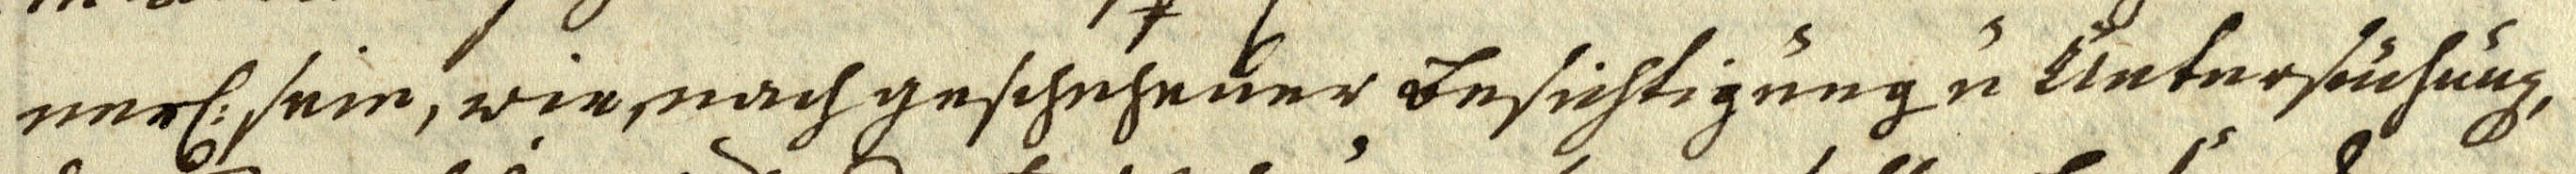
nerl. sein, wie nach geschehener Besichtigung u Untersuchung,
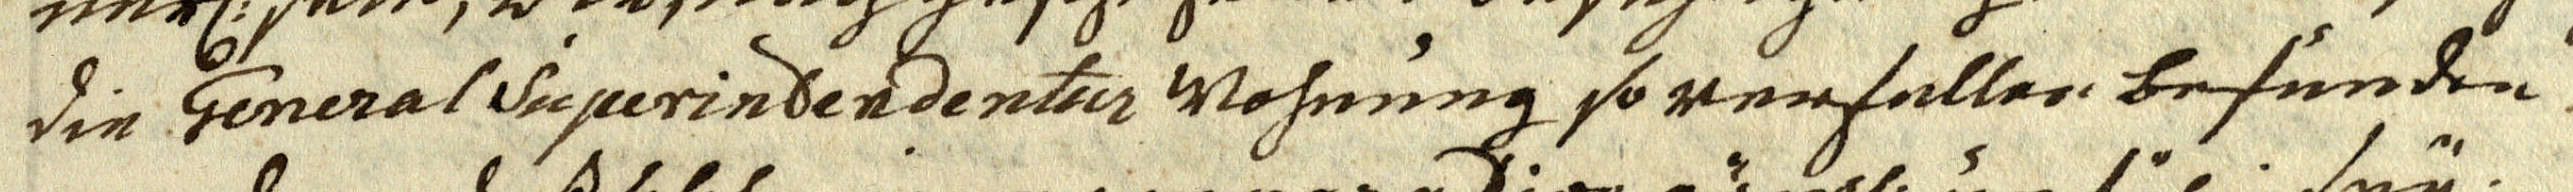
die GeneralSuperintendentur Wohnung so verfallen befunden
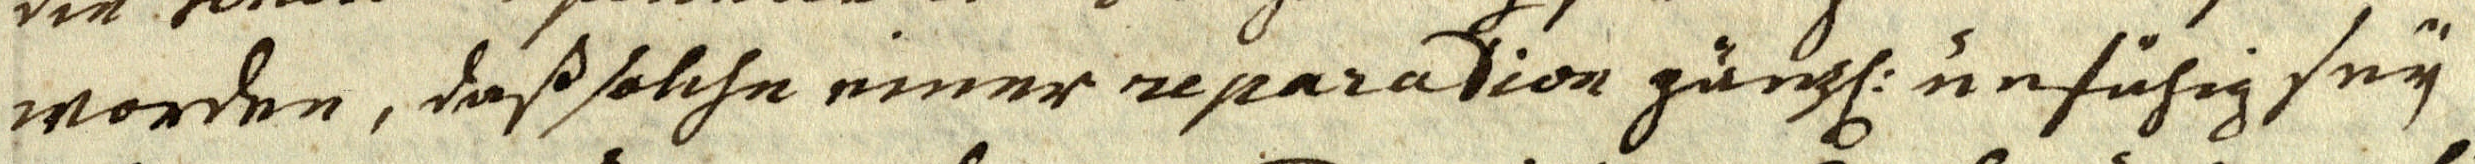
worden, daß solche einer reparation gänzl. unfähig seÿ.
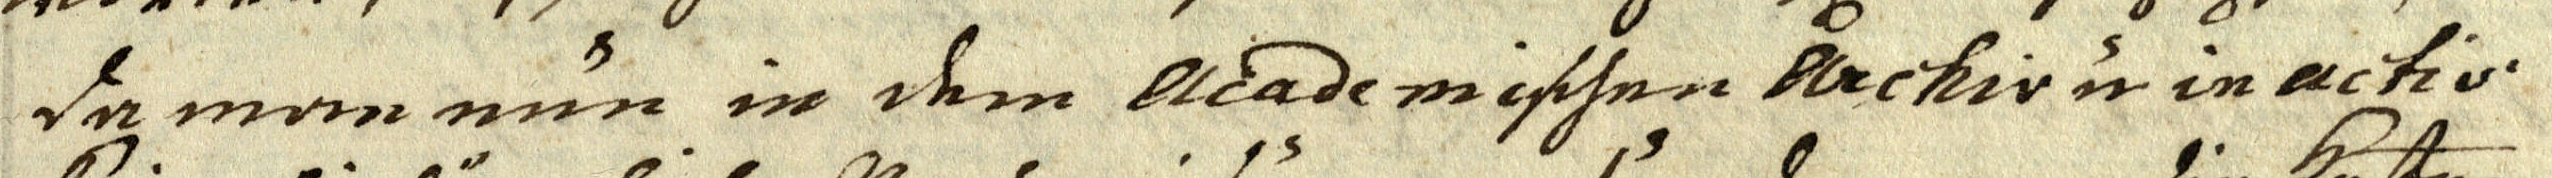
Da man nun in dem Academischen Archiv u in actis
